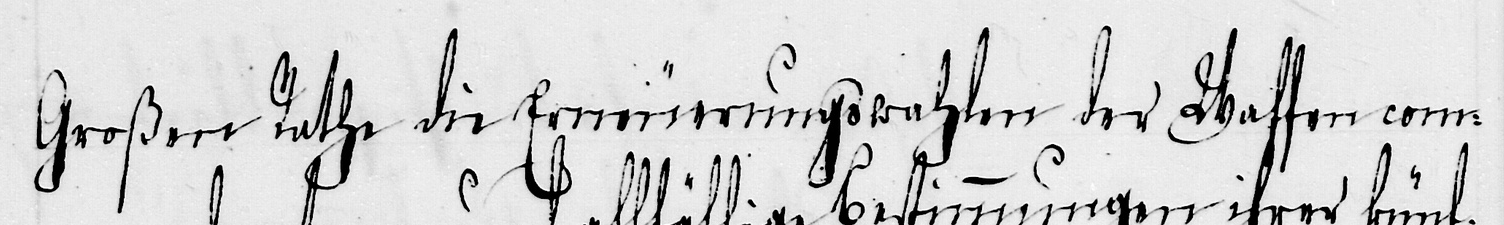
Großen Rathe die Erneuerungswahlen der Waffencom¬
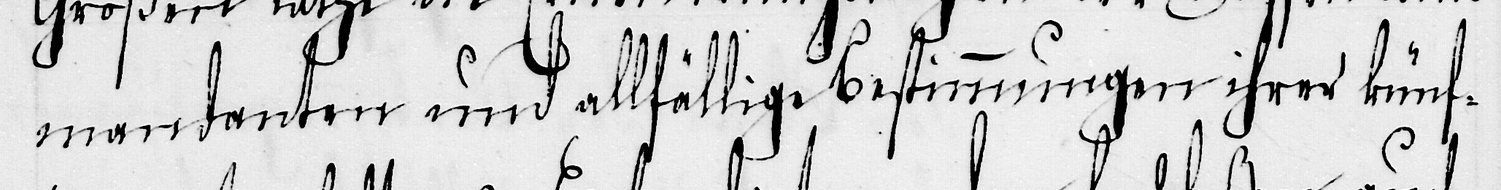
mandanten und allfällige Bestimmungen ihrer künf¬
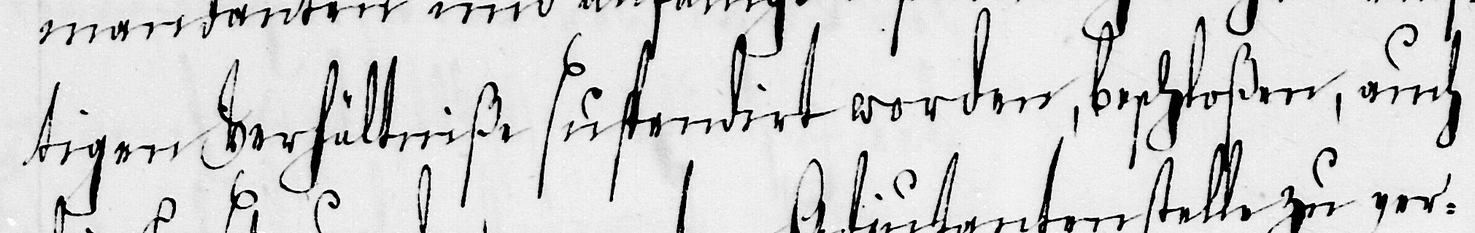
tigen Verhältniße suspendirt worden, beschloßen, auch
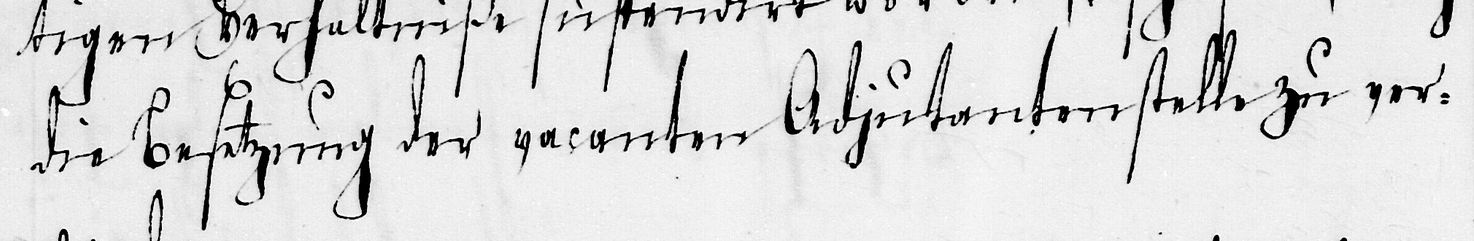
die Besetzung der vacanten Adjutantenstelle zu ver¬
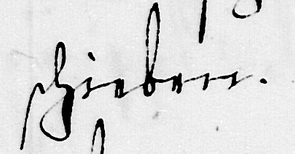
schieben.
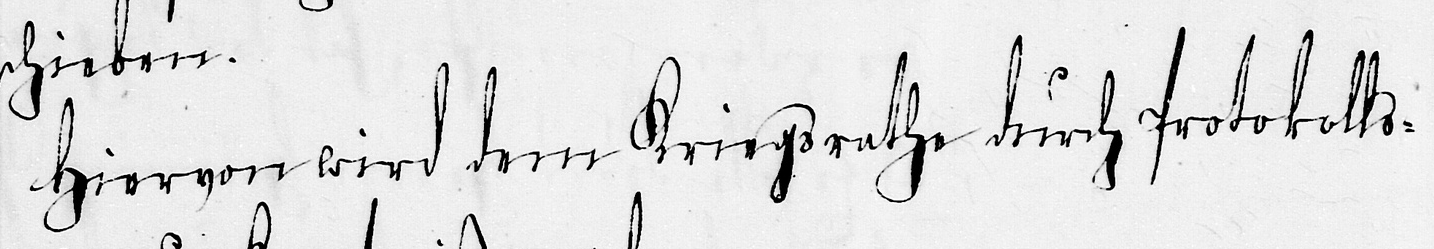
Hiervon wird dem Kriegsrathe durch Protokolls¬
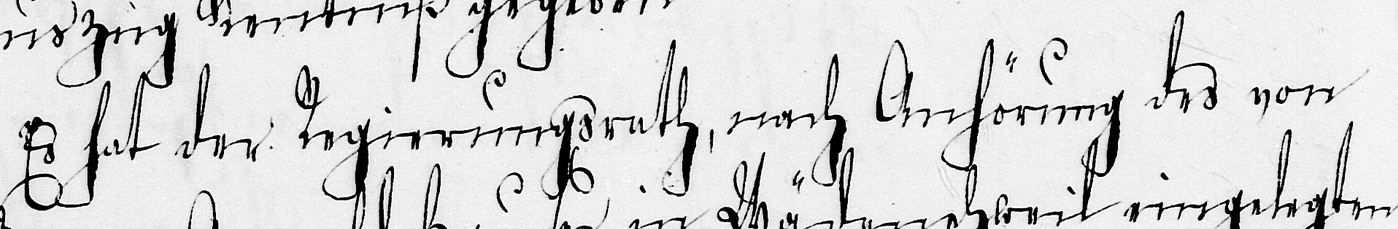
Es hat der Regierungsrath, nach Anhörung des von
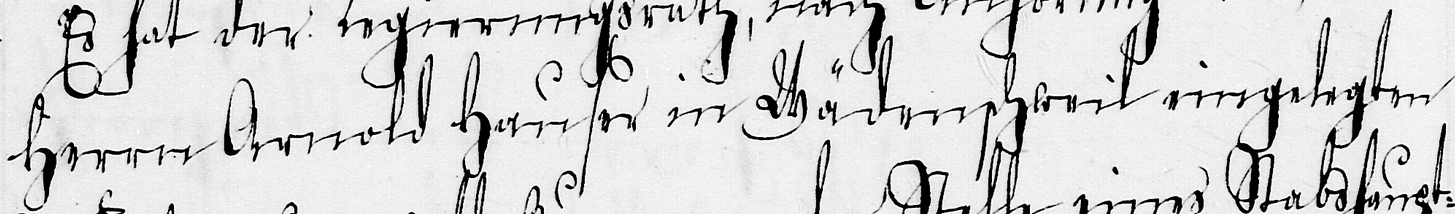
Herrn Arnold Hauser in Wädenschweil eingelegten
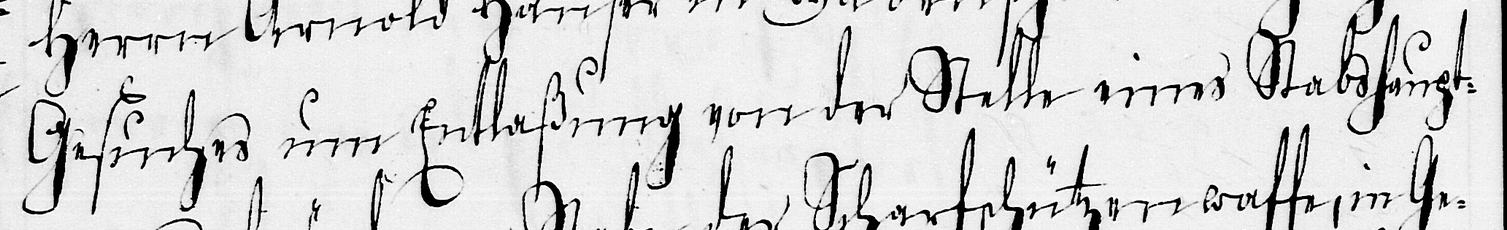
Gesuches um Entlaßung von der Stelle eines Stabshaupt¬
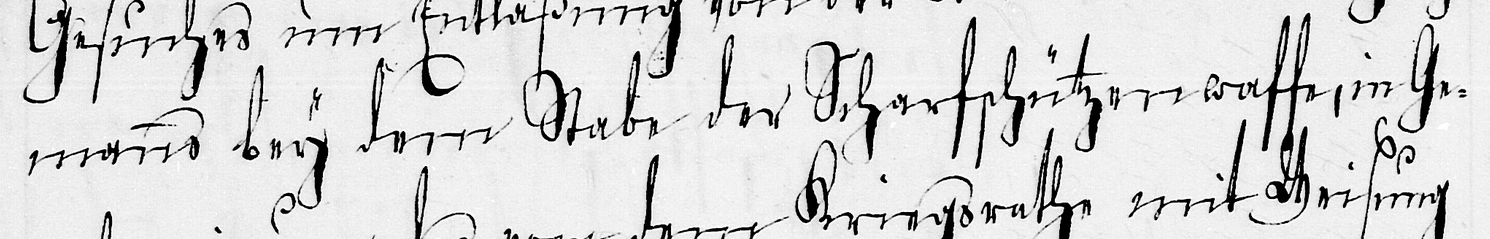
manns bey dem Stabe der Scharfschützenwaffe, in Ge¬
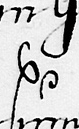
ar¬
